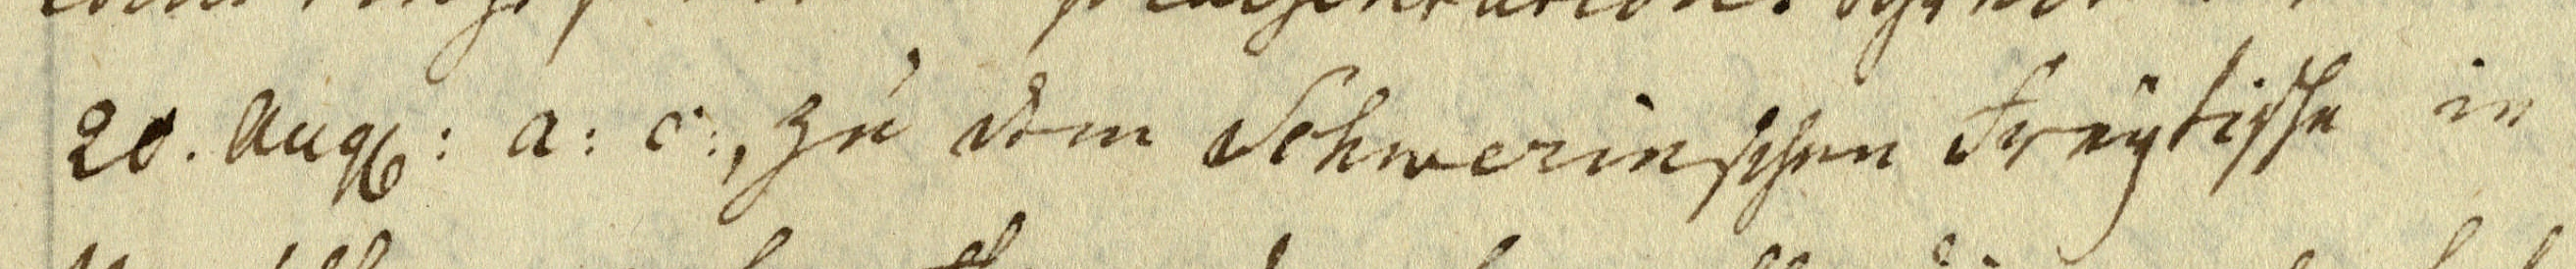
20. Aug. a. c., zu dem Schwerinschem Freÿtische in
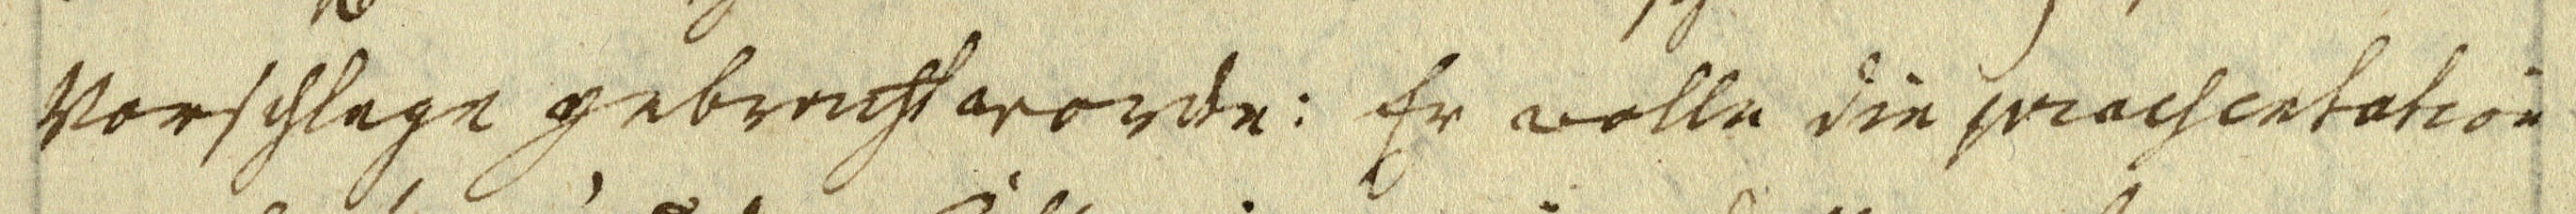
Vorschlage gebracht worden: Er wolle die praesentation
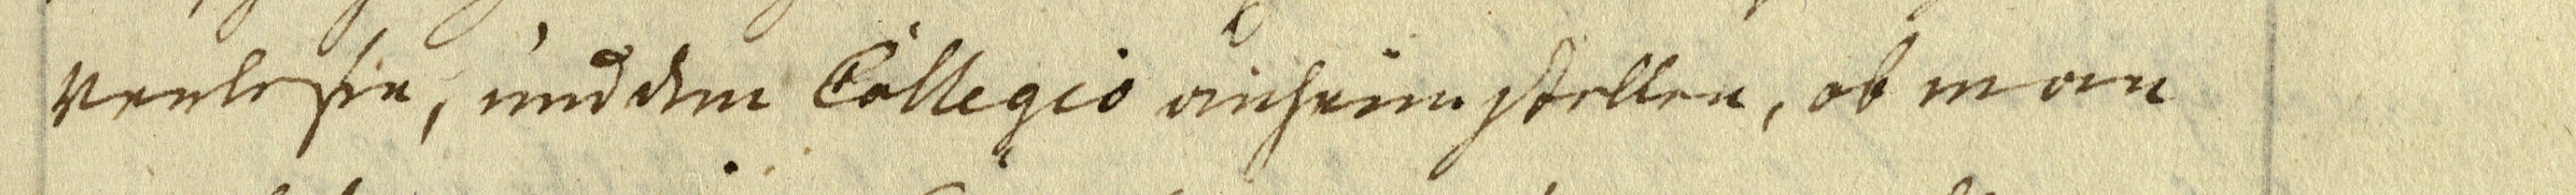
verlesen, und dem Collegio anheimstellen, ob man
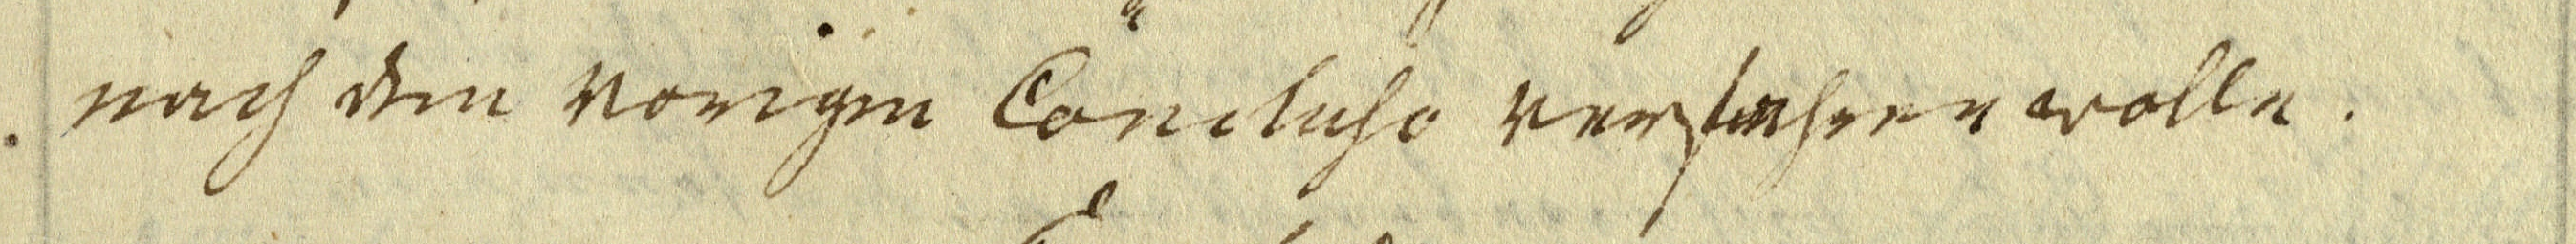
nach dem vorigen Concluso verfahren wolle.
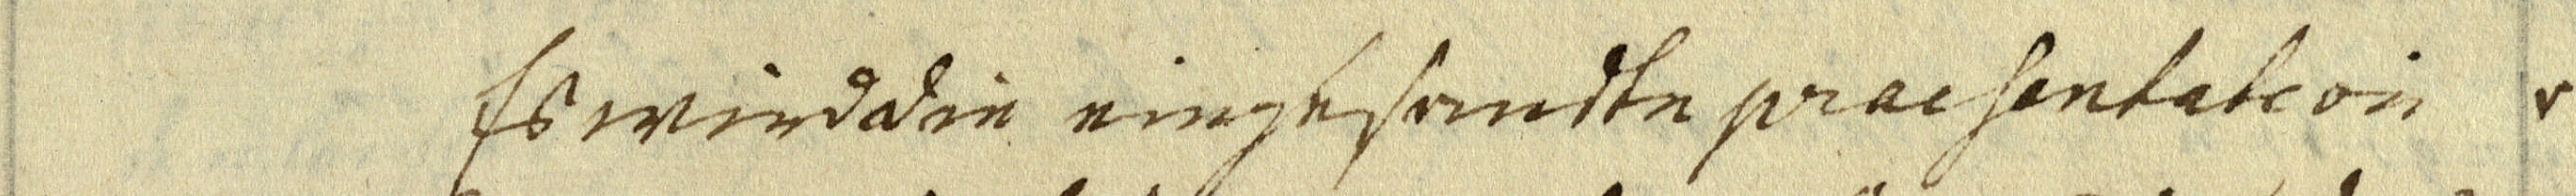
Es wird die eingesandte praesentation
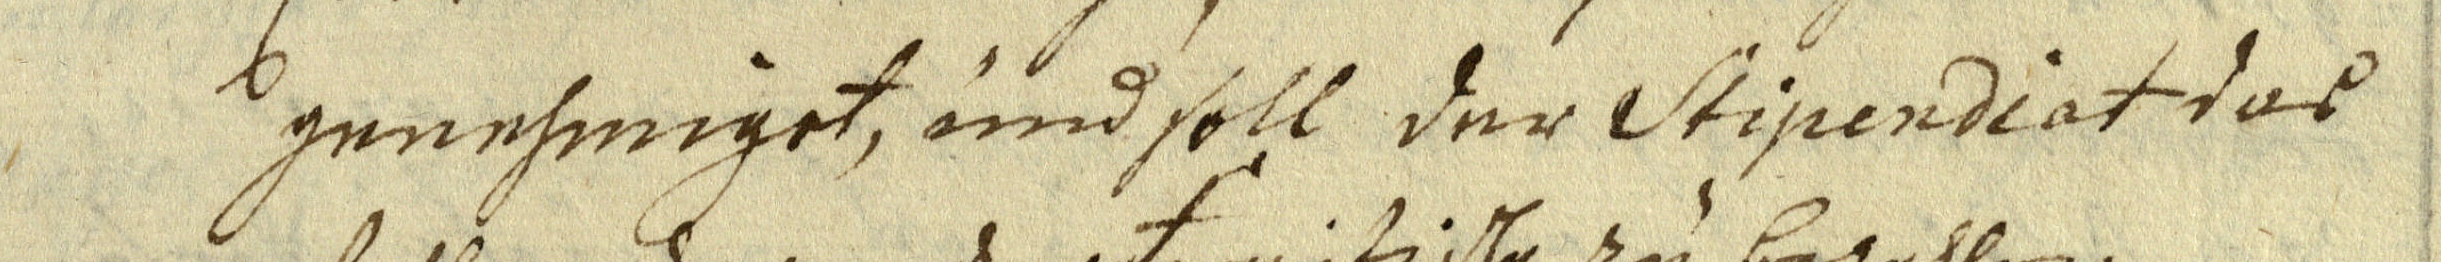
genehmiget, und soll der Stipendiat das
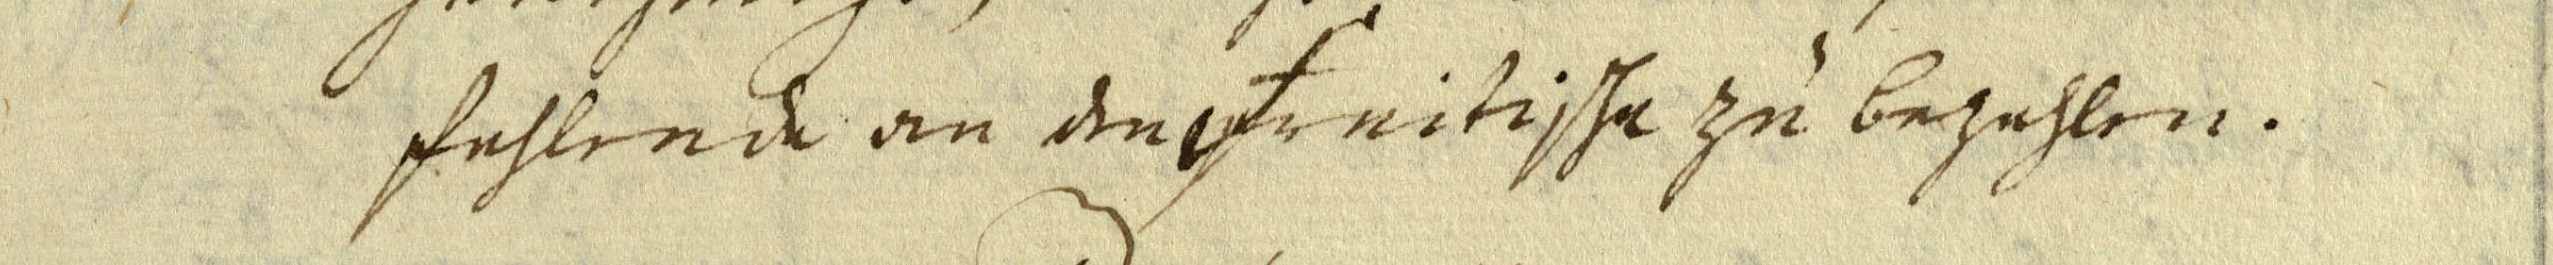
fehlende an den Freitische zu bezahlen.
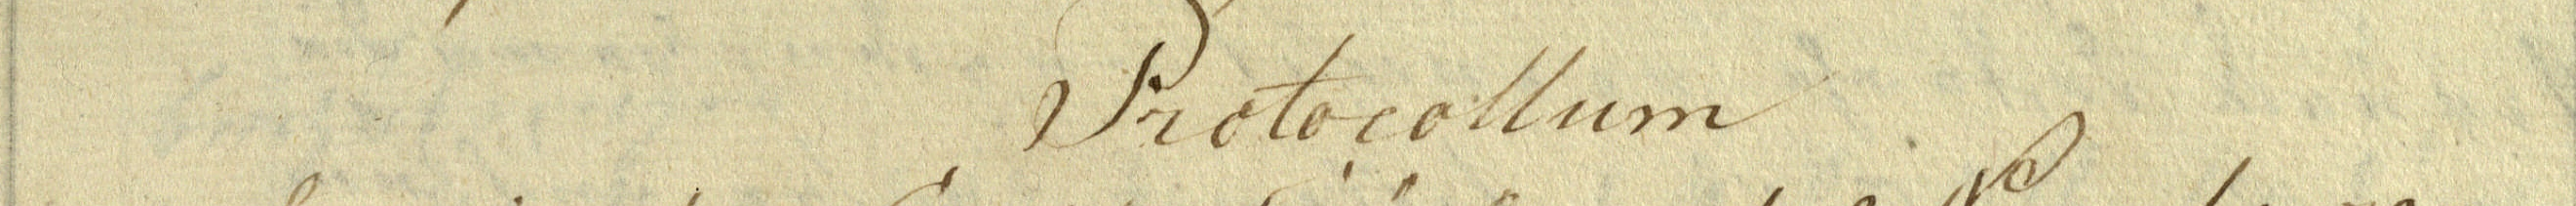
Protocollum
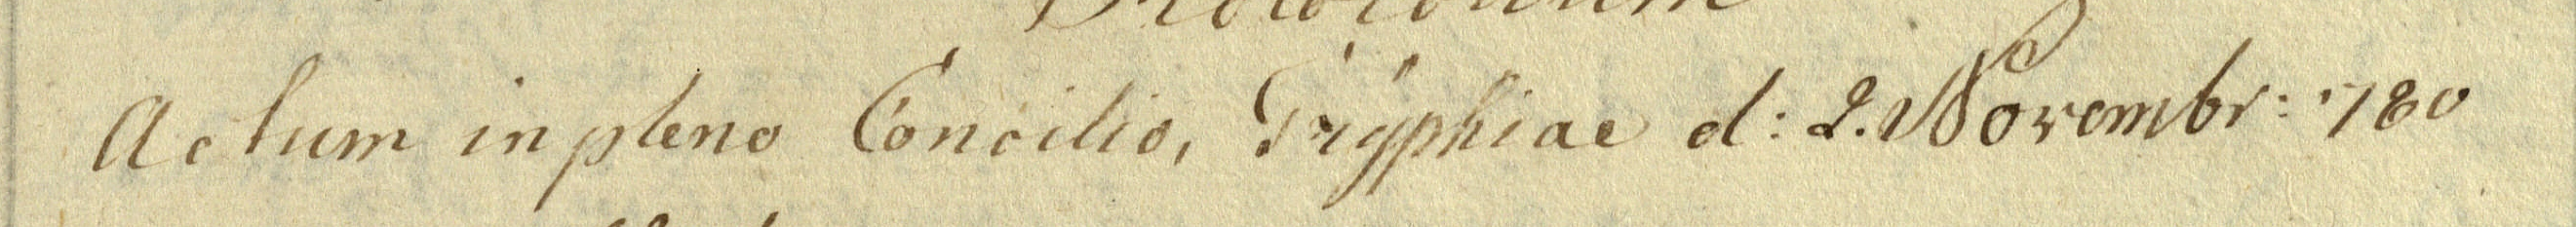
Actum in pleno Concilio, Grÿphiae d. 2. Novembr. 1780
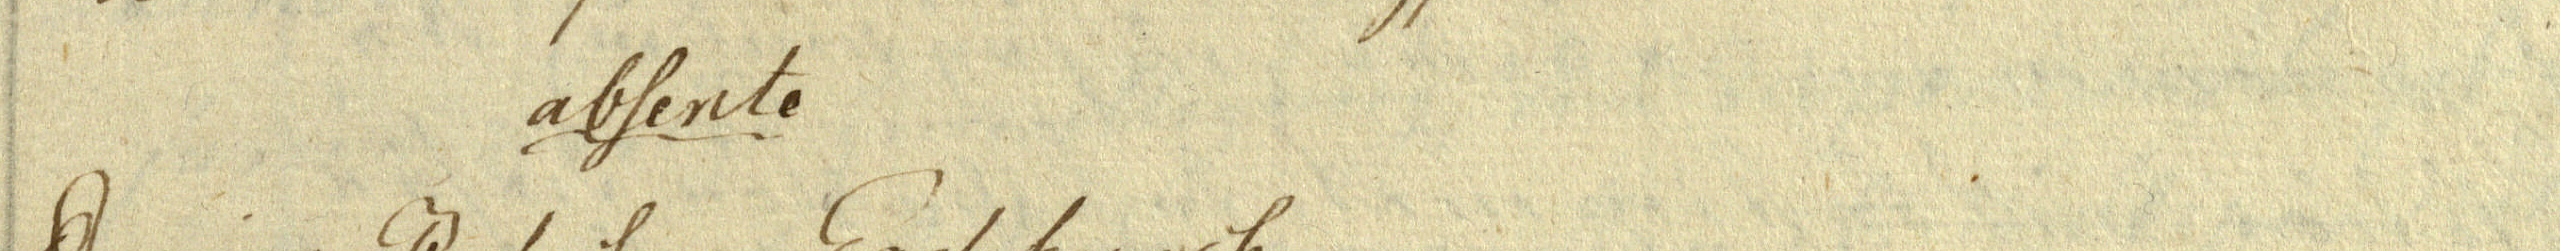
absente
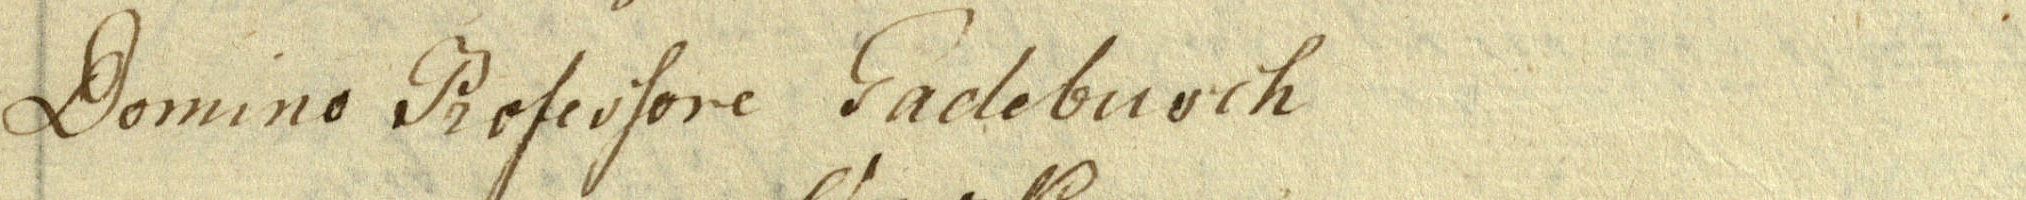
Domino Professore Gadebusch
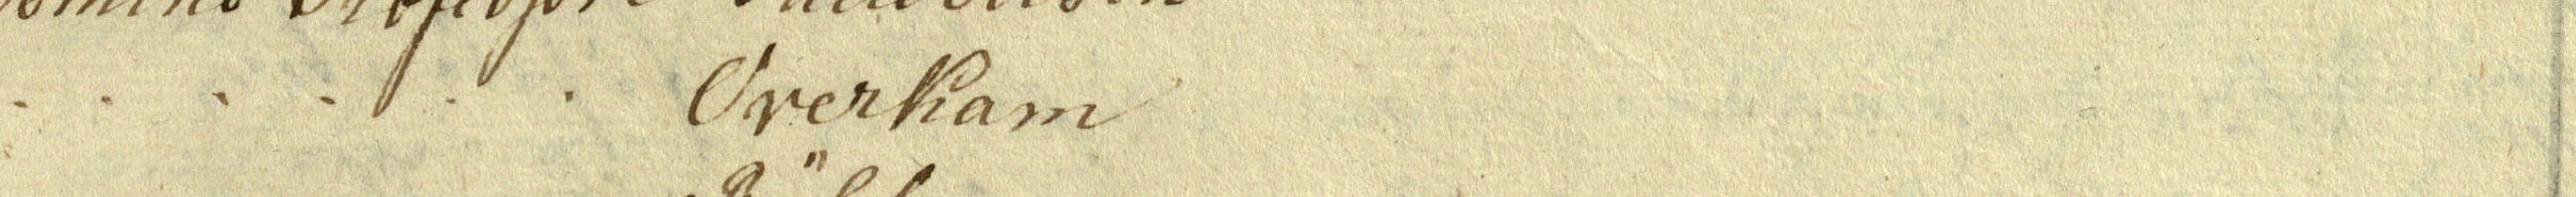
Overkam
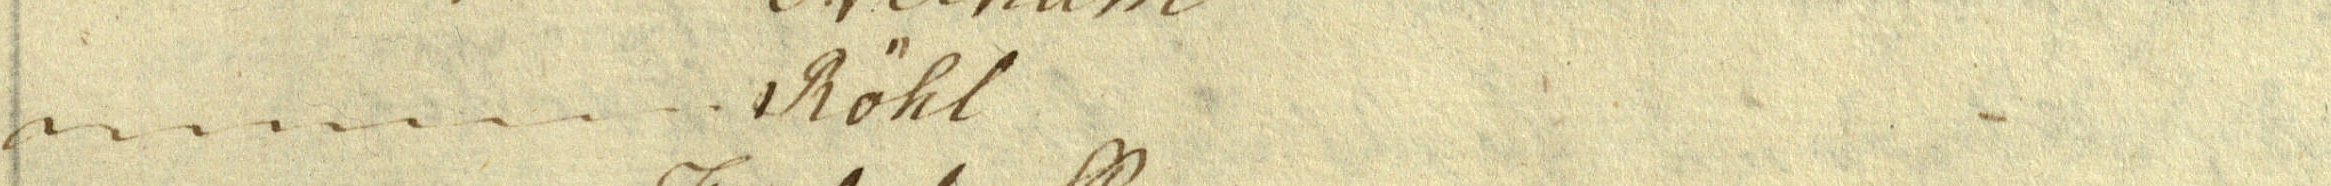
Röhl
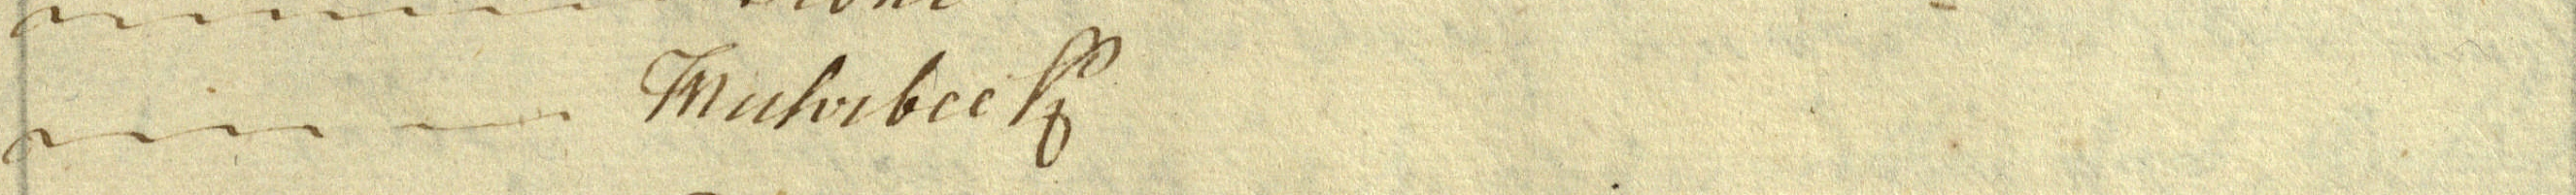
Muhrbeck
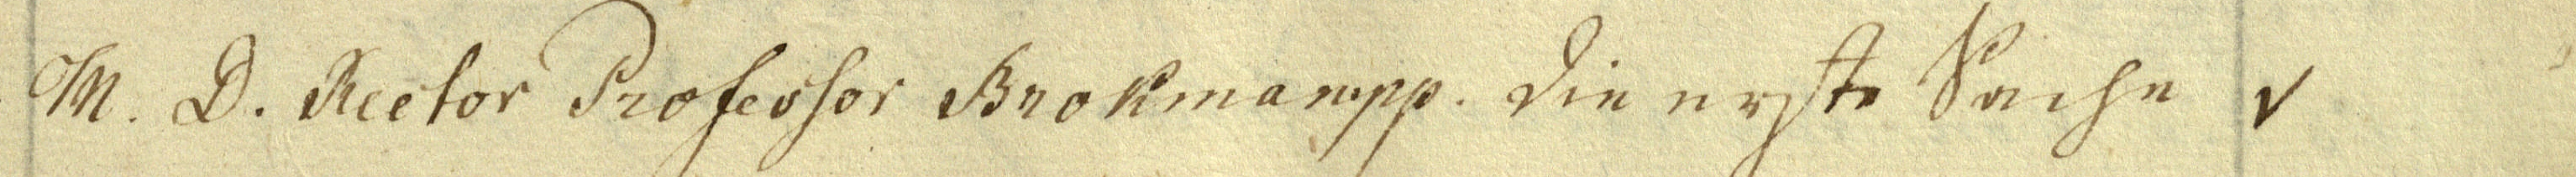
M. D. Rector Professor Brokmann pp. Die erste Sache
